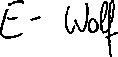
E-Wolf
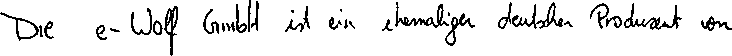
Die e-Wolf GmbH ist ein ehemaliger deutscher Produzent von
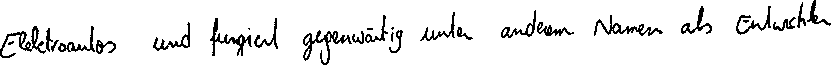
Elektroautos und fungiert gegenwärtig unter anderem Namen als Entwickler
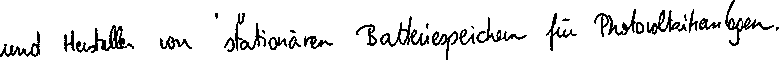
und Hersteller von stationären Batteriespeichern für Photovoltaikanlagen.
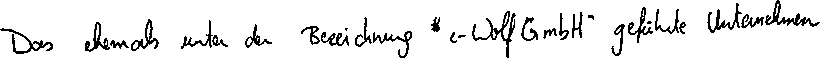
Das ehemals unter der Bezeichnung "e-Wolf GmbH" geführte Unternehmen
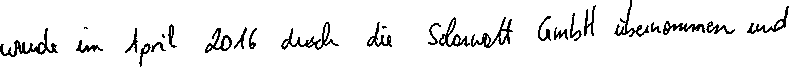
wurde im April 2016 durch die Solarwatt GmbH übernommen und
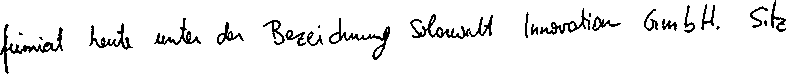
firmiert heute unter der Bezeichnung Solarwatt Innovation GmbH. Sitz
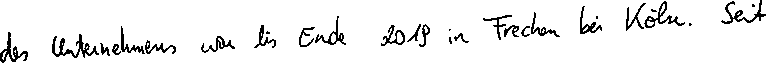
des Unternehmens war bis Ende 2019 in Frechen bei Köln. Seit
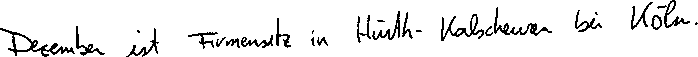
Dezember ist Firmensitz in Hürth-Kalscheuren bei Köln.
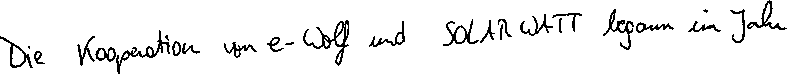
Die Kooperation von e-Wolf und SOLARWATT begann im Jahr
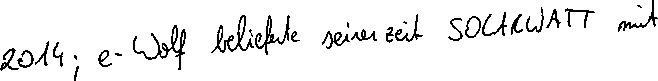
2014; e-Wolf belieferte seinerzeit SOLARWATT mit
